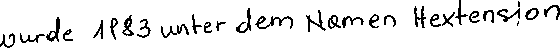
wurde 1983 unter dem Namen Hextension
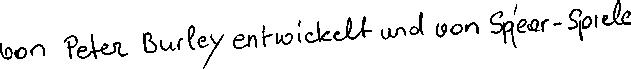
von Peter Burley entwickelt und von Spear-Spiele
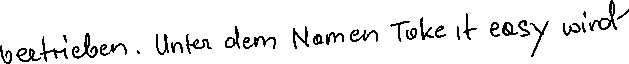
vertrieben. Unter dem Namen Take it easy wird-
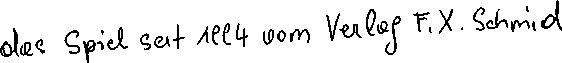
das Spiel seit 1994 vom Verlag F.X. Schmid
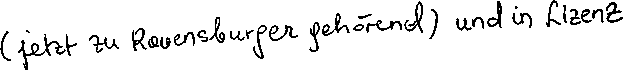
(jetzt zu Ravensburger gehörend) und in Lizenz
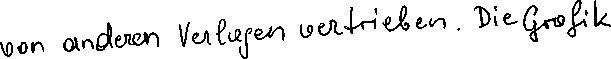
von anderen Verlagen vertrieben. Die Grafik
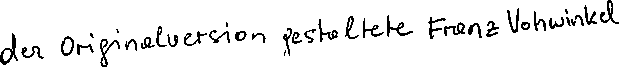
der Originalversion gestaltete Franz Vohwinkel
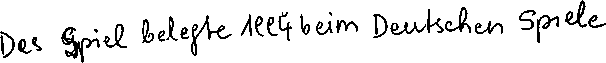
Das Spiel belegte 1994 beim Deutschen Spiele
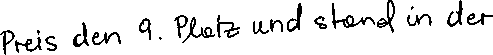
Preis den 9. Platz und stand in der
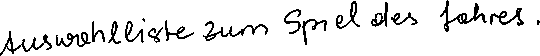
Auswahlliste zum Spiel des Jahres.
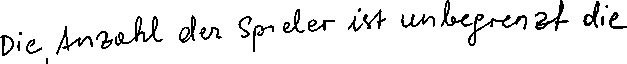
Die Anzahl der Spieler ist unbegrenzt, die
